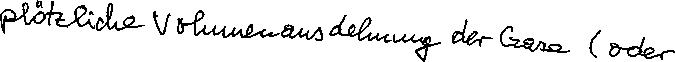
plötzliche Volumenausdehnung der Gase (oder
